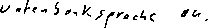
atenbanksprache an.
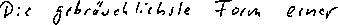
Die gebräuchlichste Form einer
